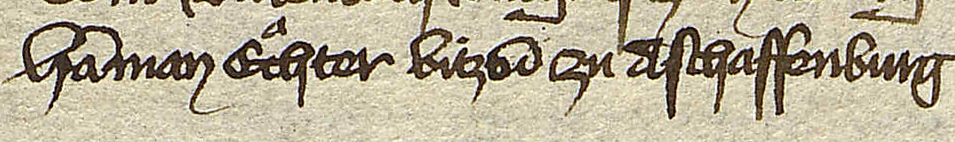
Ha*man Ëchter vitʒtu* cʒu Aſchaffenburg*
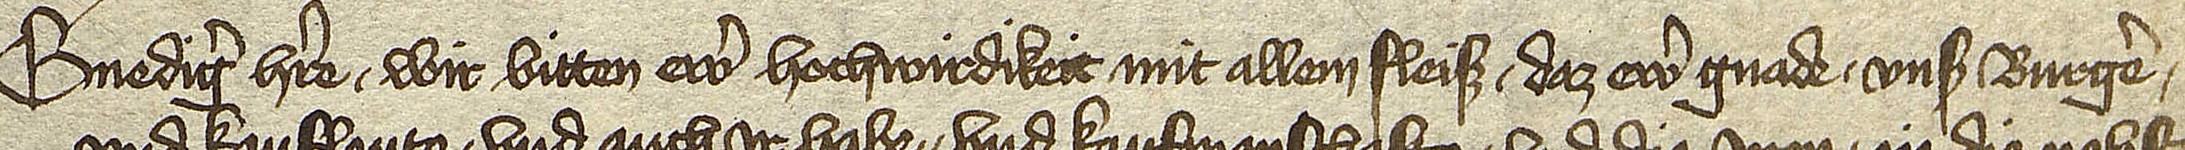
Gnedig* h*re / wir bitten ew* hochwirdikeit mit allem fleiſʒ / daʒ ew* gnade / vnſ* Burge* /
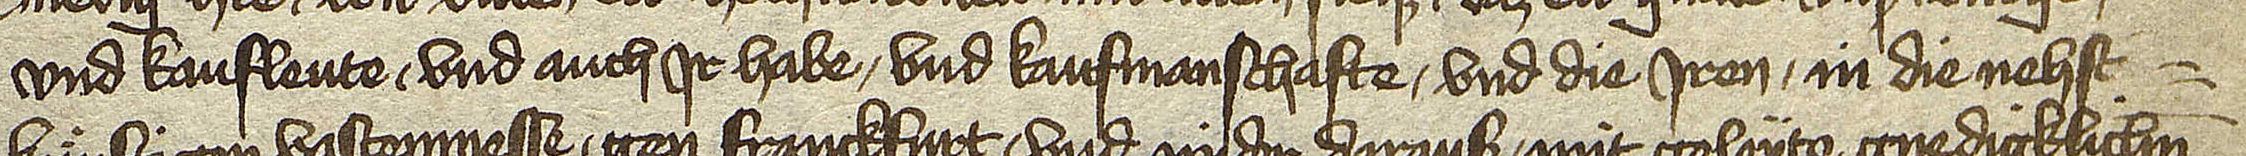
vnd kaufleute / vnd auch Ir habe / vnd kaufmanſchafte / vnd die Iren / in die nehſt =
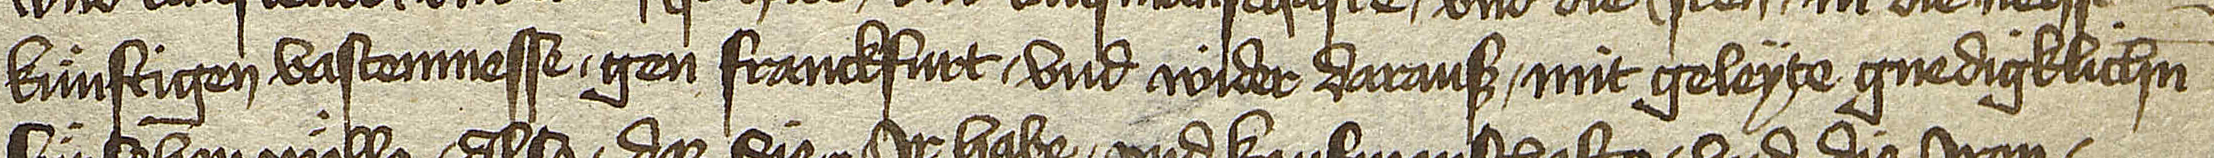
künftigen vaſtenmeſſe / gen franckfurt / vnd wider darauſʒ / mit geleyte gnedigklichn*
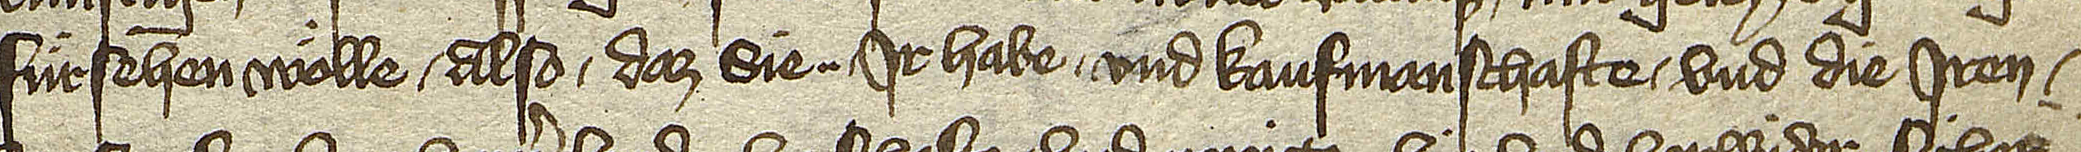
fürſehen wölle / Alſo / daʒ Sie ~ / Ir habe / vnd kaufmanſchafte / vnd die Iren /
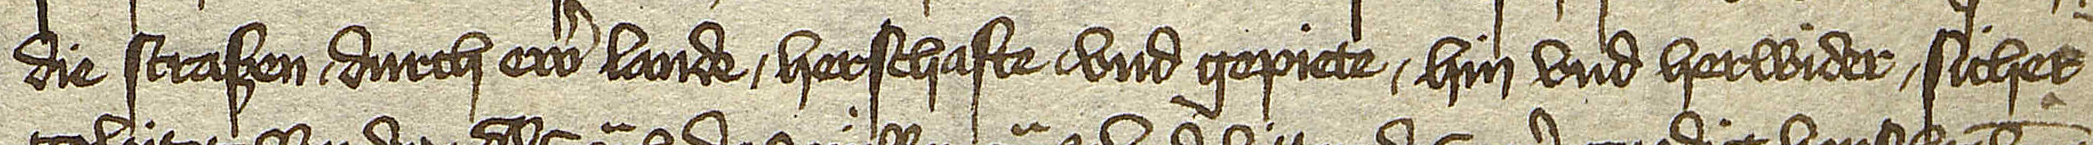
die ſtraſʒen / durch ew* lande / herſchafte / vnd gepiete / hin vnd herwider / ſicher
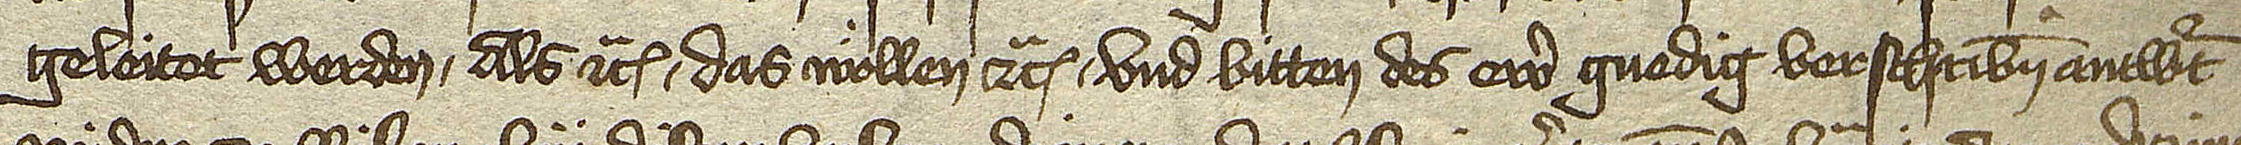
geleitet werden / Als ec* / das wöllen ec* / vnd bitten des ew* gnedig verſchribn* antw*t
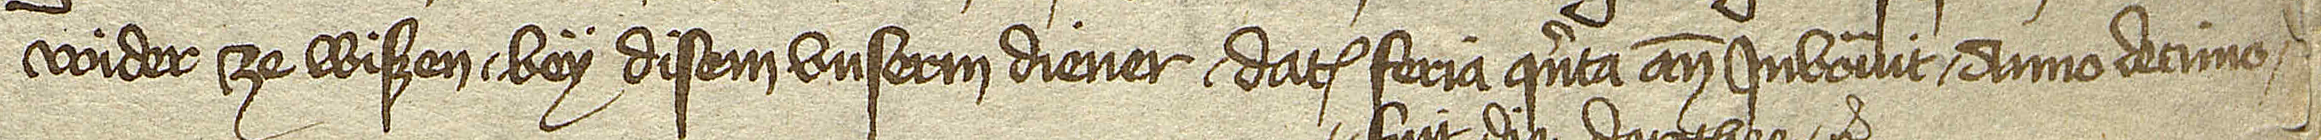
wider cʒe wiſʒen / bey diſem vnſerm diener / dat* feria q*nta an* Invo*uit / Anno decimo /
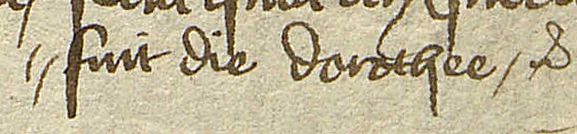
// fuit die dorothee / §
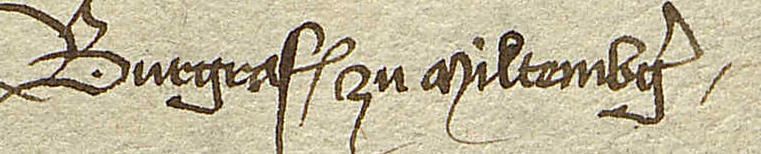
Burggraf* cʒu Miltembg* /
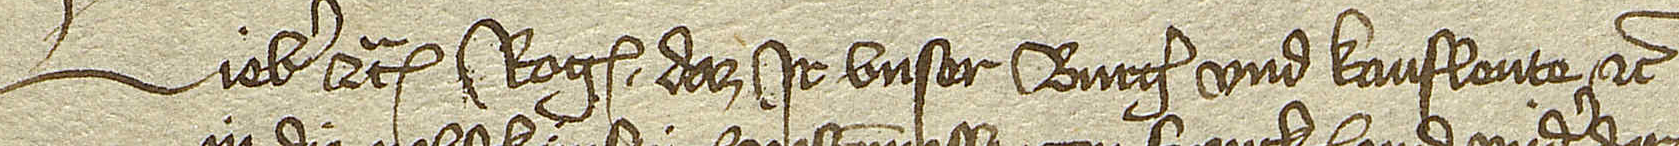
Lieb* ec* Rog* / daʒ Ir vnſer Burg* vnd kaufleute / ec*
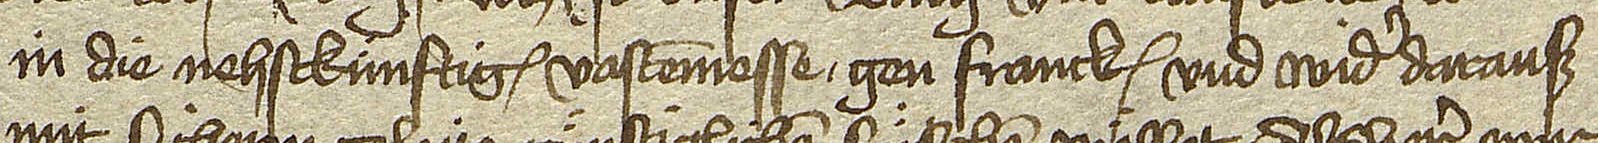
in die nehſtkünftig* vaſte*meſſe / gen franck* vnd wid* darauſʒ
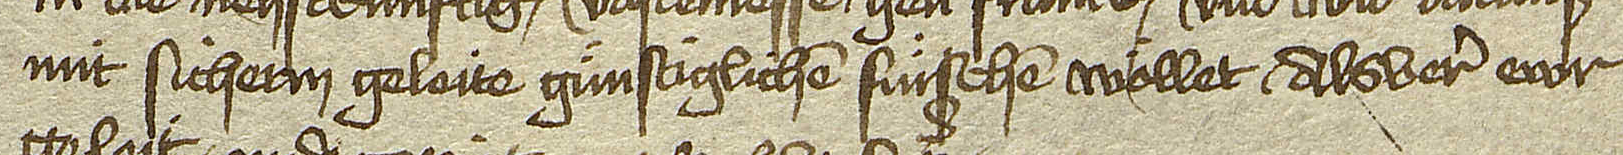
mit ſicherm geleite günſtigliche* fürſehe* wöllet / Alsver* ewr
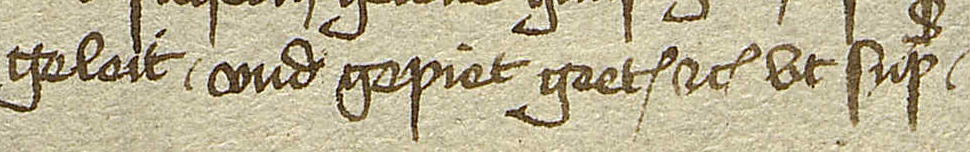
geleit / vnd gepiet geet / ec*vt ſup* /
